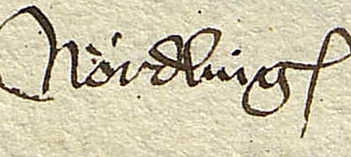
Nördling*
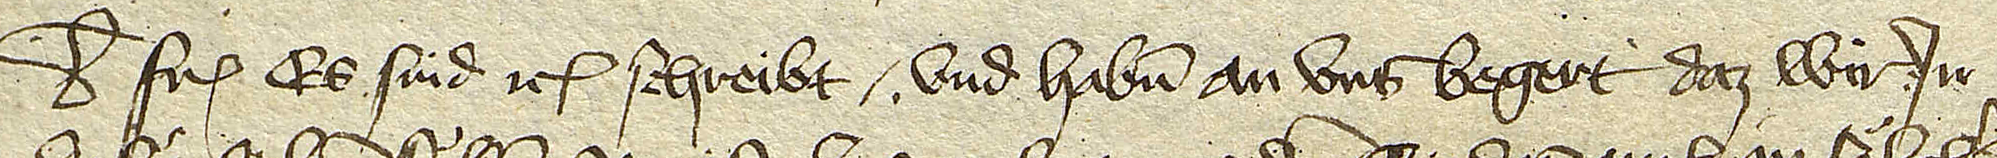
L* fr* Es ſind ec* ſchreibt / . vnd habn* an vns begert daʒ wir In
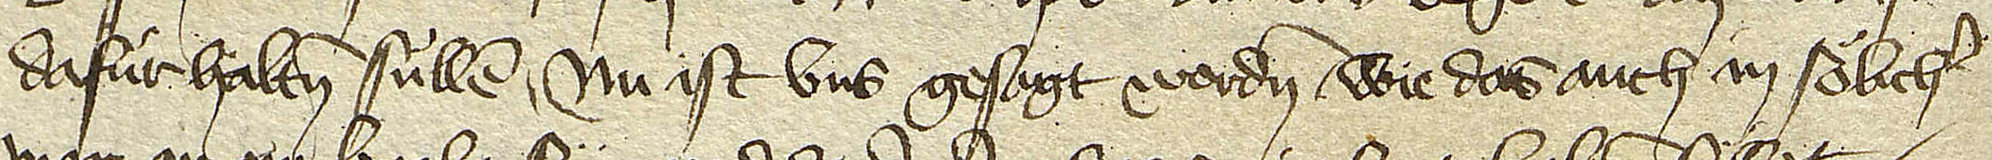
dafür haltn* ſülle* / Nu iſt vns geſagt wordn* / wie das auch in ſölich*
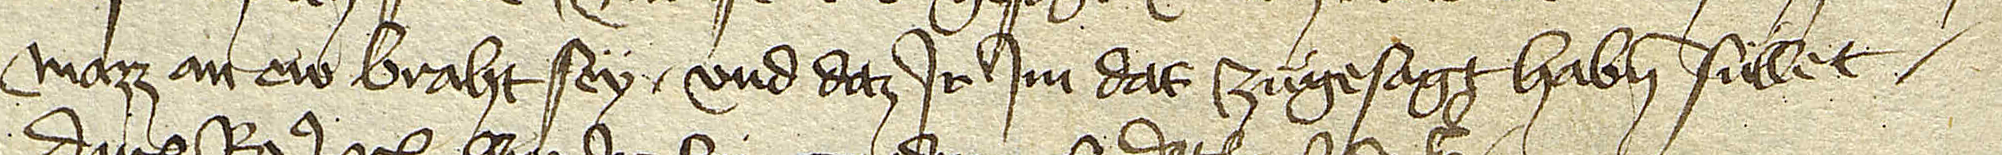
maʒʒ an ew braht ſey / vnd daʒ Ir Im das cʒügeſagt habn* ſüllet /
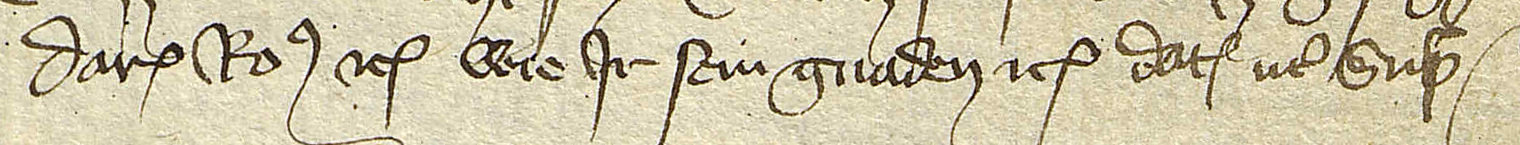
Dar* Ro* ec* wie Ir ſein gnaden ec* dat* ut* Sup* /
